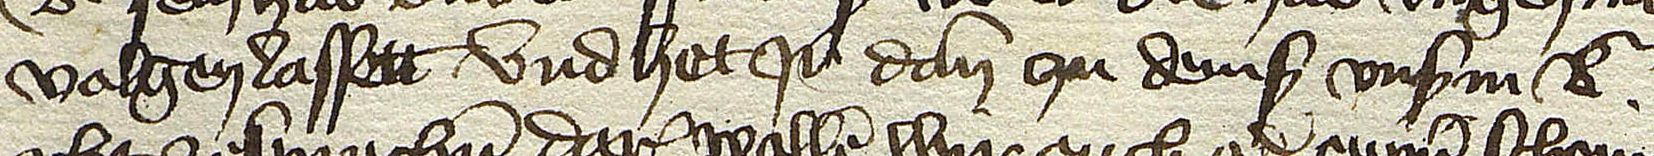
volgen laſſett / vnd het Ir dan* cʒu demſ* vnſ*m B* .
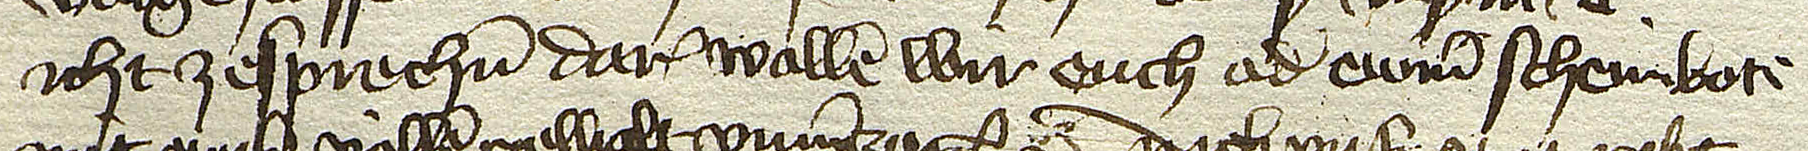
icht ʒeſprech*n dar* wolle* wir euch od* ew*m ſcheinbote
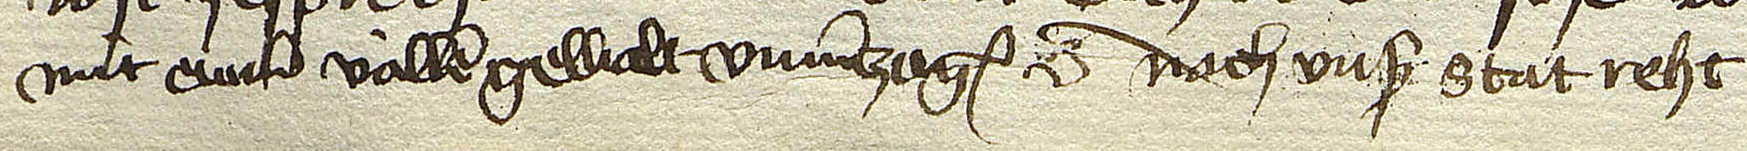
mit ew*m völle* gewalt vnu*cʒog* ec* nach vnſ* Stat reht
